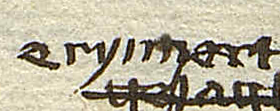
erynnert
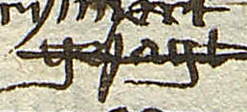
geſagt
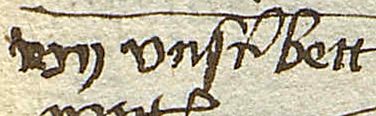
von vnſ*r bett
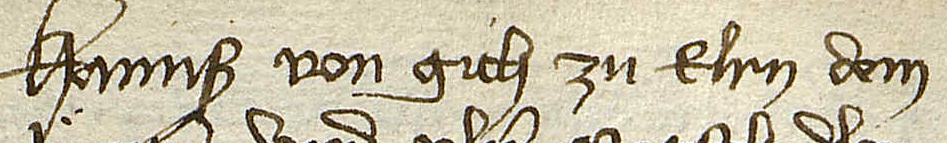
Hannſ* von gich ʒu Elrn dem
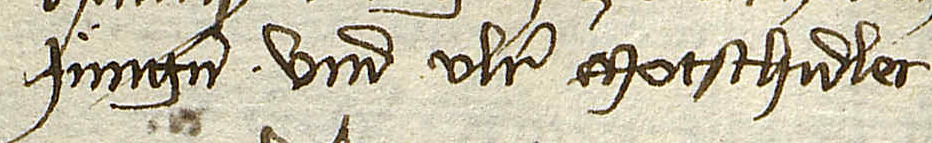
Iüng*n . Vnd vlr* Motſchidler
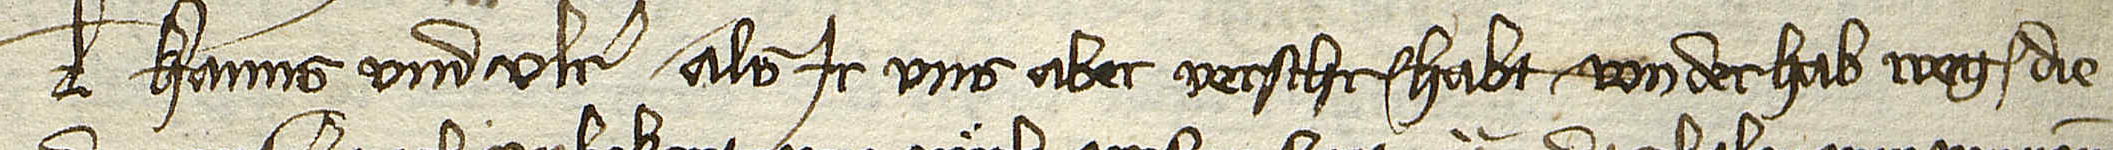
L Hanns vnd vlr* / als Ir vns aber verſchr* habt / von der hab weg* die
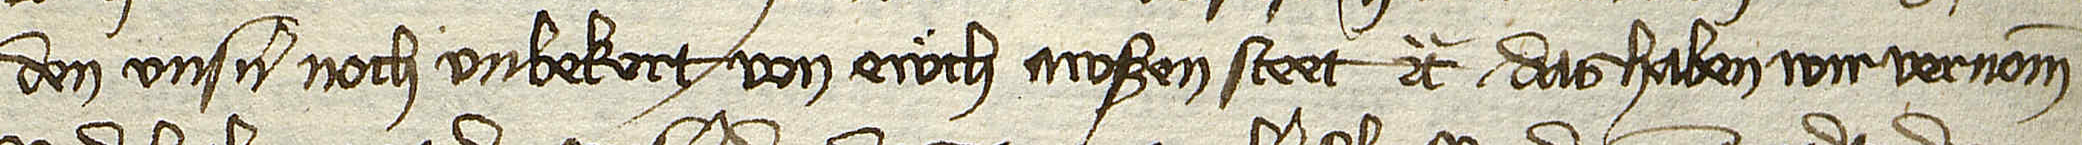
den vnſ*n noch vnbekert von eẅch awſʒen ſteet ec* / das haben wir vernom*
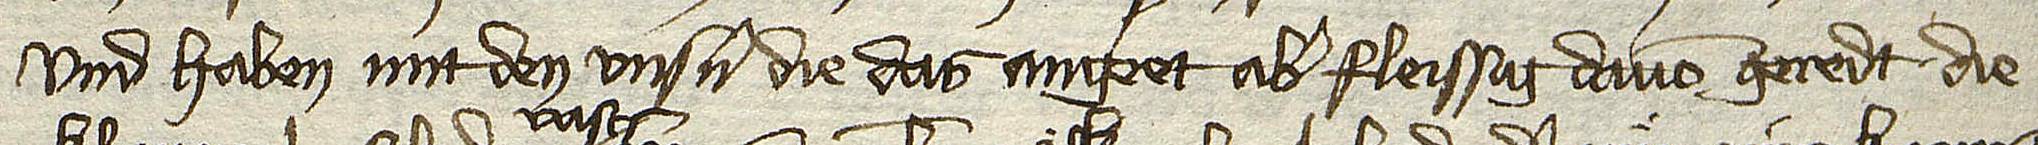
Vnd haben mit den vnſ*n die das angeet ab* fleiſſig dauo* geredt / die
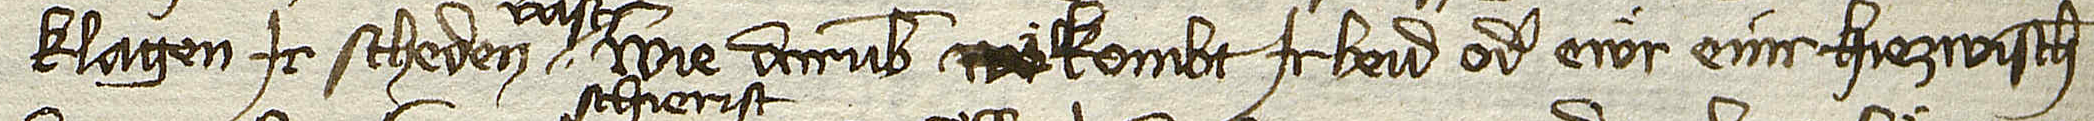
klagen Ir ſcheden / Wie darub* wi kombt Ir beid od* eẅr einr hieʒwiſch*
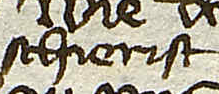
ſchieriſt
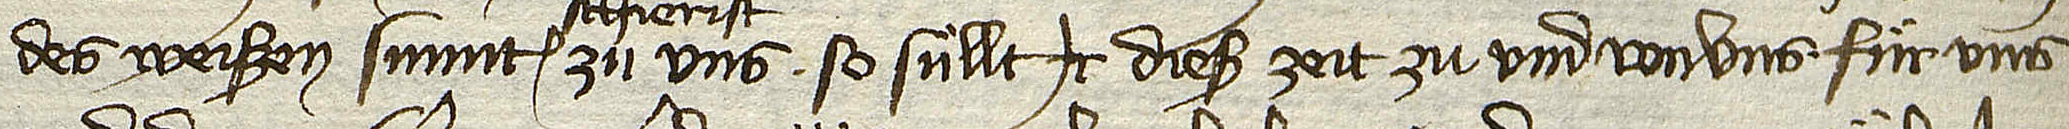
des weiſʒen ſunnt* ʒu vns . ſo ſüllt Ir dieſ* ʒeit ʒu vnd von Vns . für vns
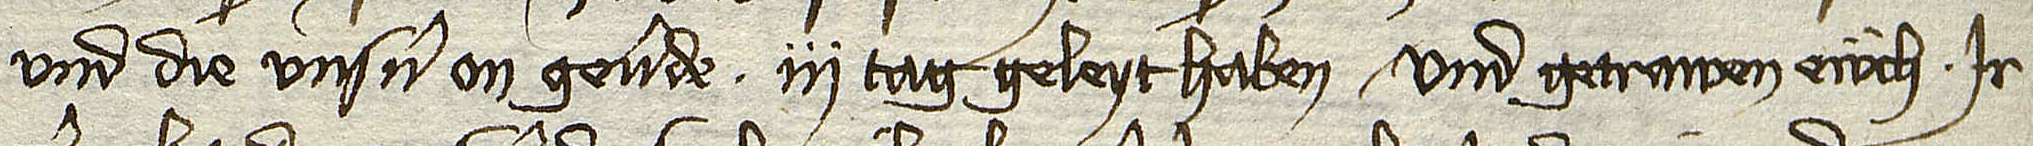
vnd die vnſ*n on geu*de . iii tag geleyt haben / Vnd getrawen eẅch . Ir
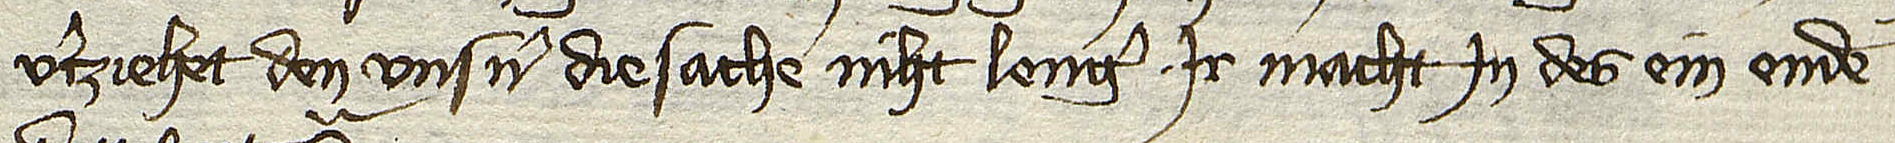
v*cʒiehet den vnſ*n die ſache niht leng* . Ir macht In des ein ende
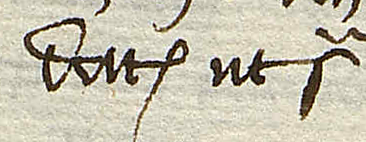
Dat ut ſ*
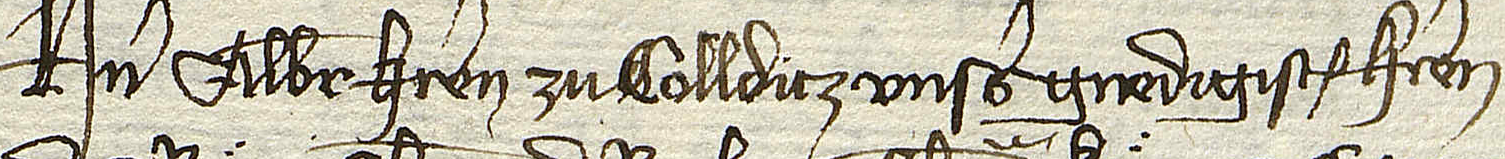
Hn* Albr* h*ren ʒu Colldicʒ vnſ*s genedigiſt* h*ren
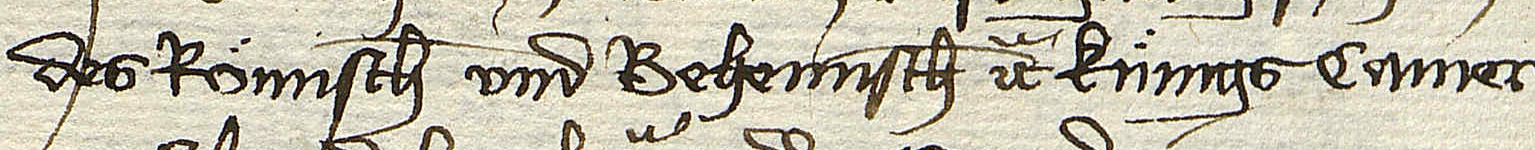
des Römiſch* vnd Beheimſch* ec* künigs Camer =
